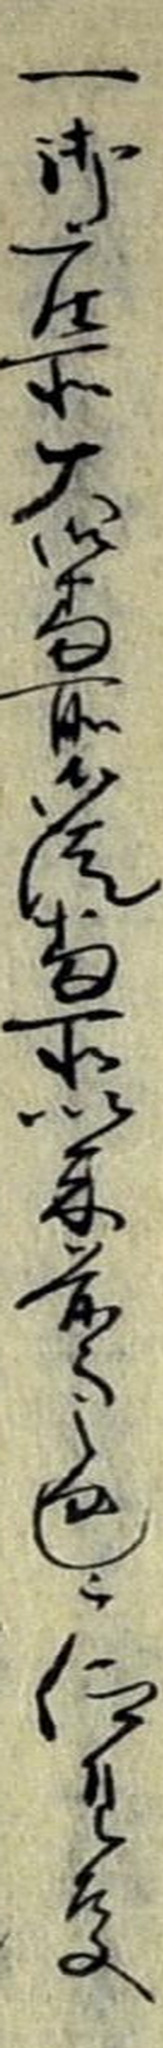一御座所大御番所御徒番所以来前々之通被仰付候事
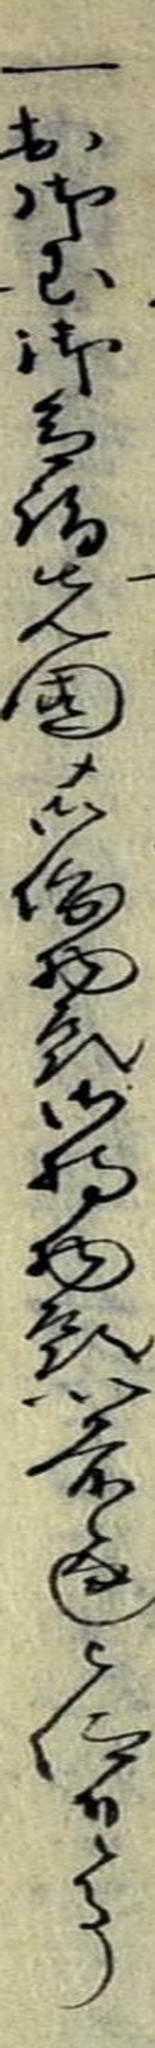一於御国御参詣先固メ御側物頭御持物頭以前之通被仰付候事
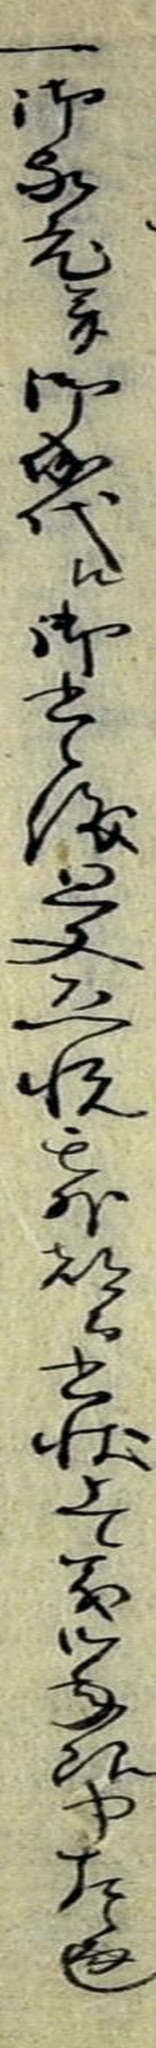一御家老并御城代江御書之儀且又恐悦其外都而書状上候義御年限中左之通
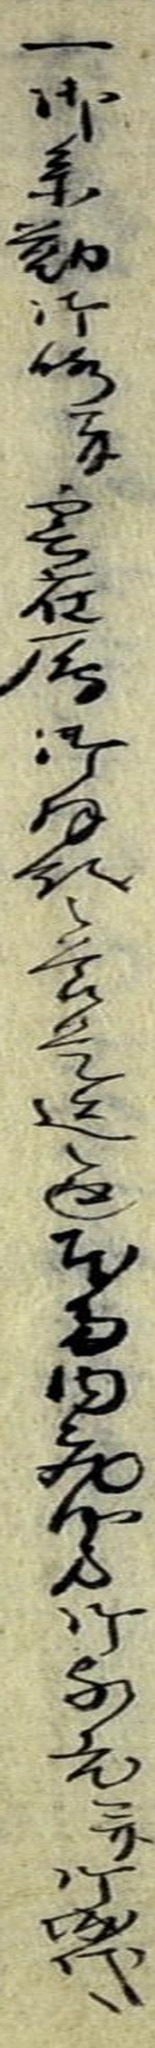一御参勤御暇并雲雀鳫御拝領之節是迄之通本多内蔵助方御家老并御城代へ
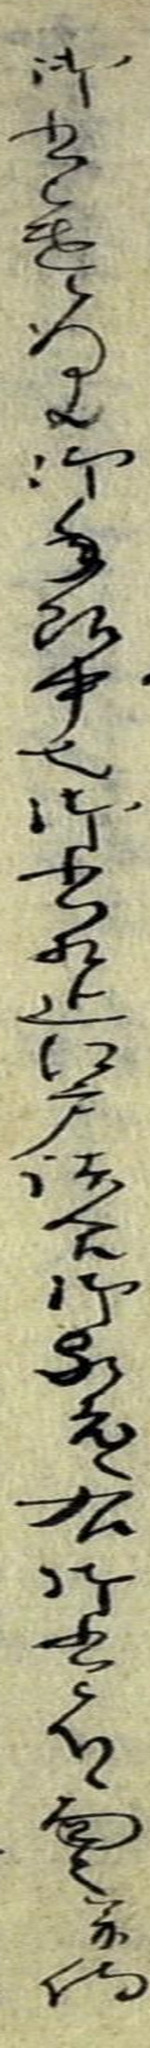御書被遣候得共御年限中者御書相止江戸詰合御家老へ右御書被下候面々并侍
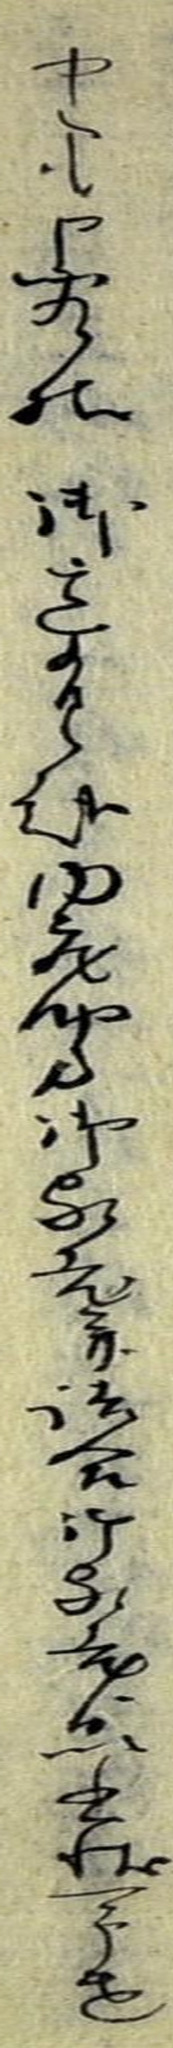中へも申聞候様御意有之趣内蔵助方御家老并詰合御家老ゟ以書状可申遣
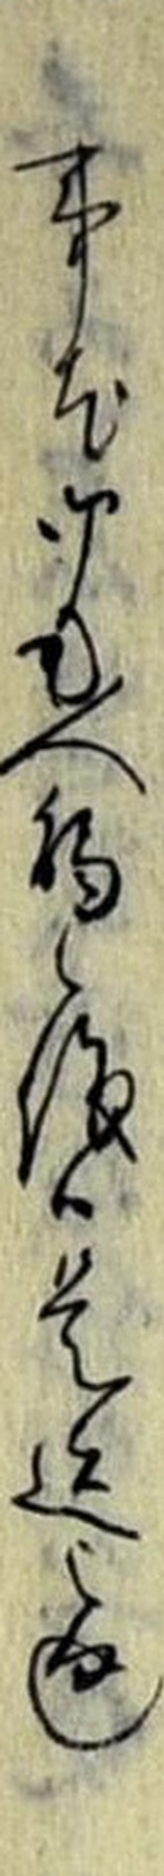事尤御用人触之儀ハ是迄之通
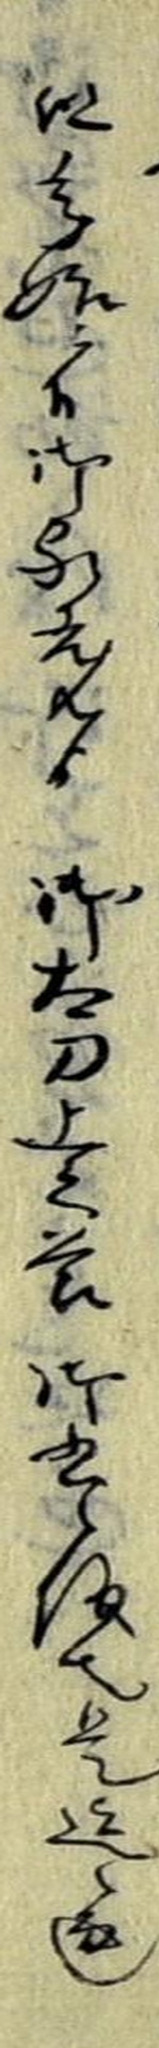但年始ニ付御家老共ゟ御太刀上之節御書之儀者是迄之通

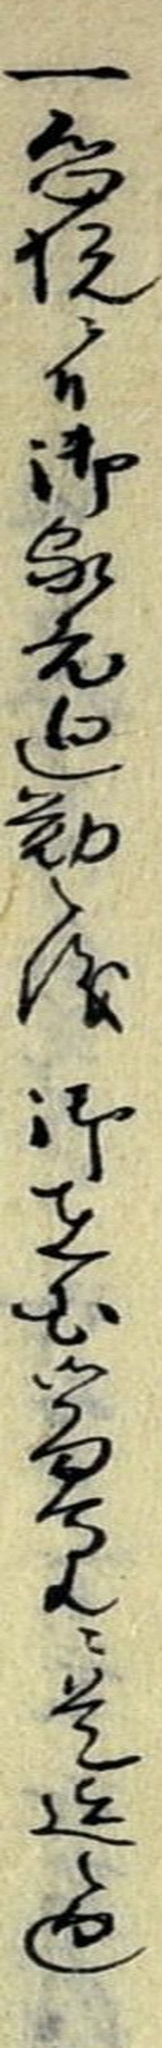一恐悦ニ付御家老廻勤之儀御在国御留守共ニ是迄之通
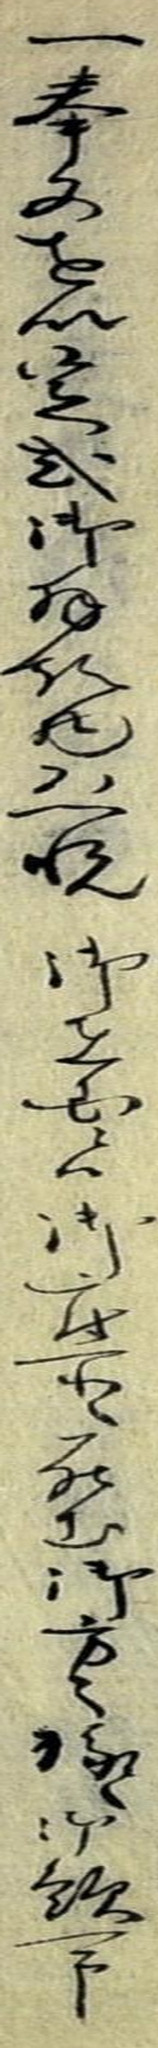一奉文を以定式御拝領物恐悦御在国ニハ御座所へ罷出御方々様へ御歓可申
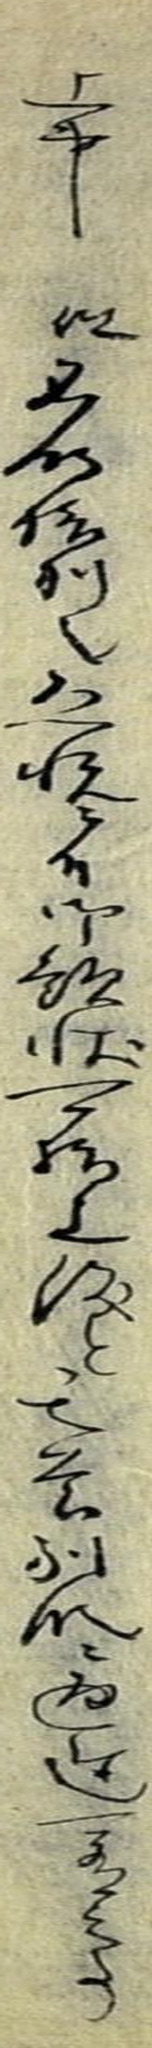上事但不時格別之恐悦ニ付御歓状可指上儀と其節別段ニ通達可有之事
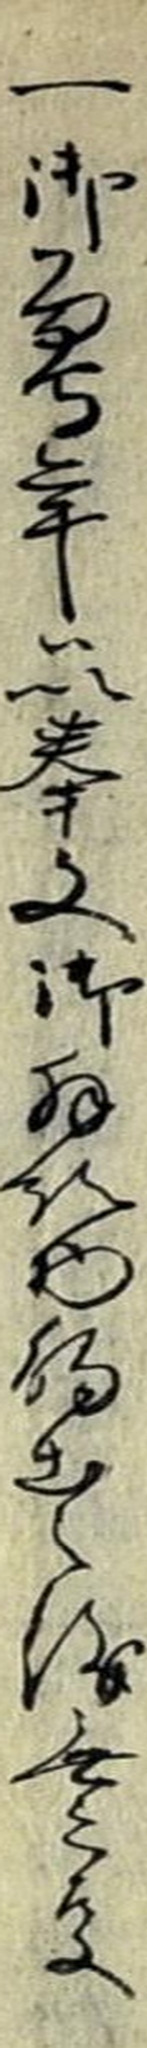一御留守年ハ以奉文御拝領物触出候儀無之事
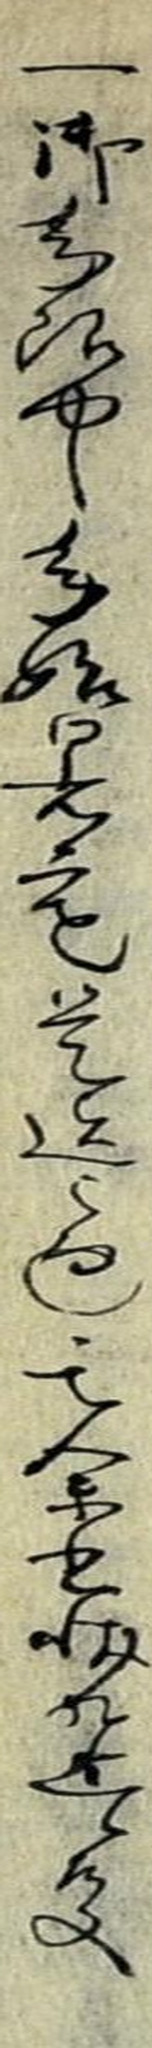一御年限中年始暑寒是迄之通其余書状相止候事
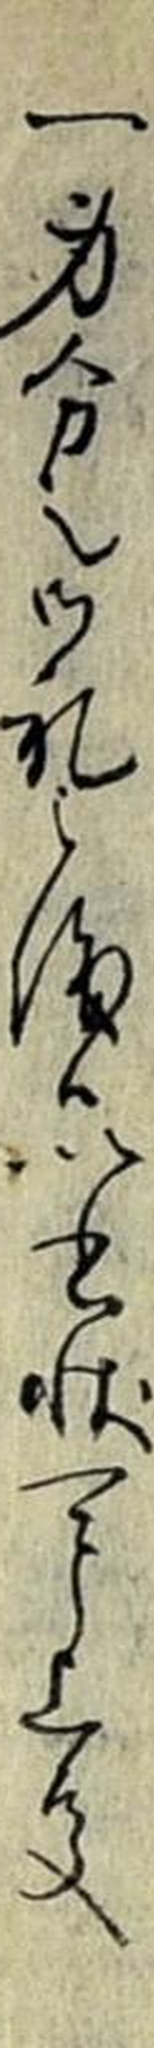一身分之御礼之儀ハ以書状可申上事
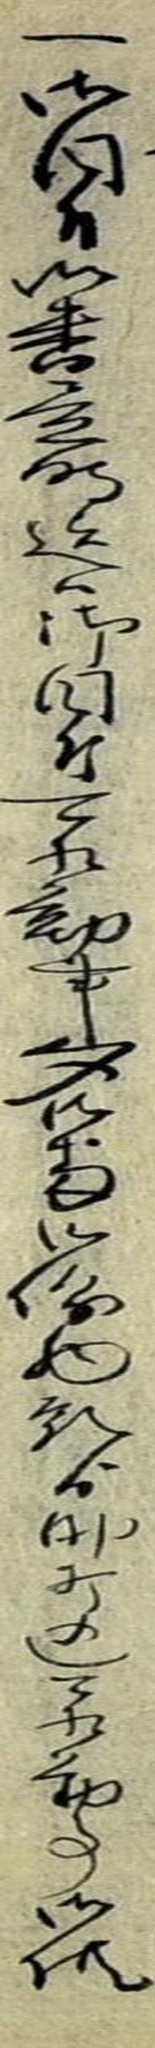一御目付御番昼時迄ハ御目付可相勤事夕御番御儀物頭ゟ助打込可相勤事御供
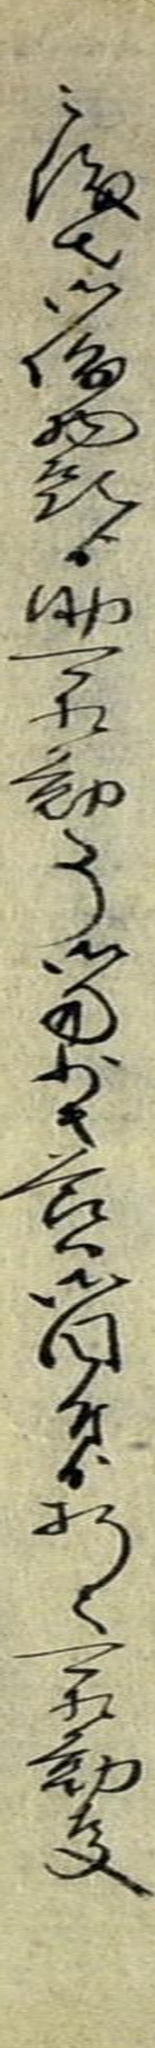之儀者御側物頭ゟ助可相勤事御用少キ節ハ御目付ゟ折々可相勤事
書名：命令之部 三
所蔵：福井県文書館 Fukui Prefectural Archives
